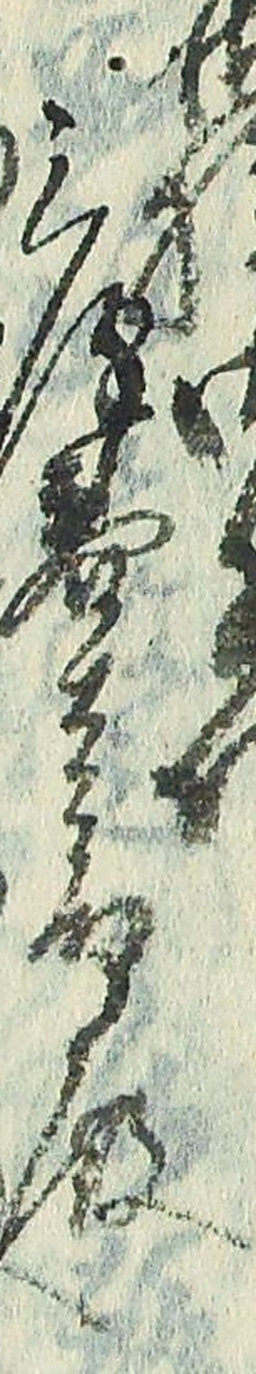三沢春太郎殿
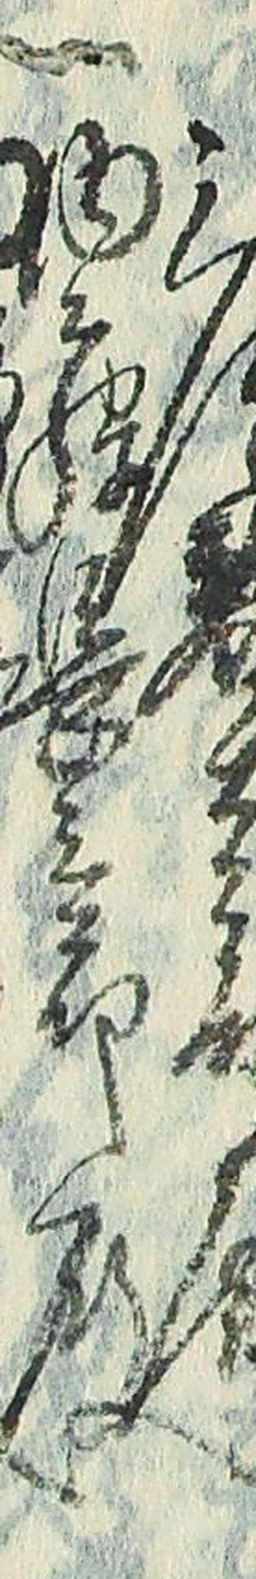内藤長三郎殿
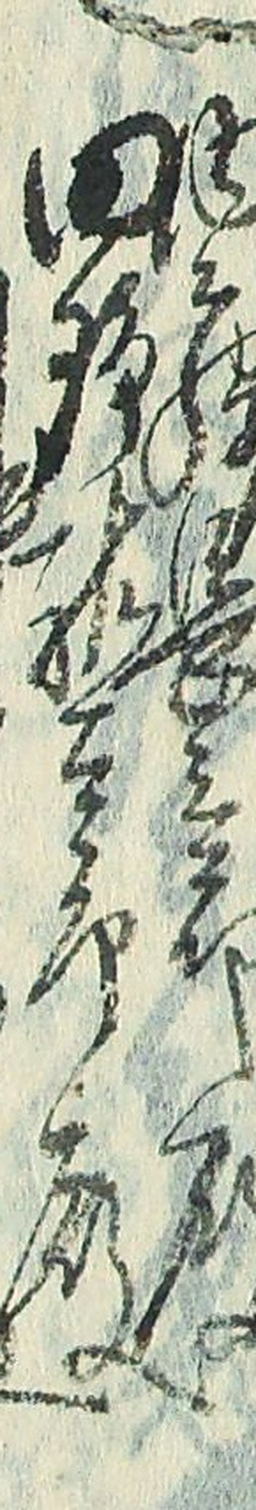田野祐太郎殿
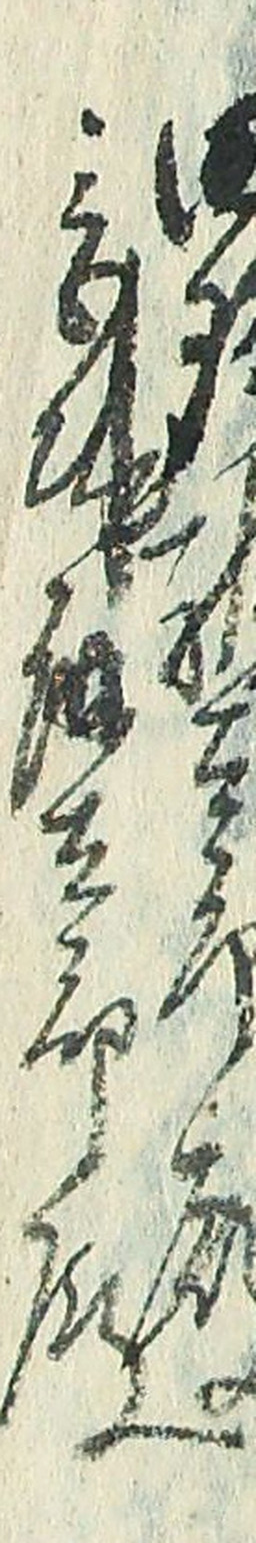宮城麻太郎殿

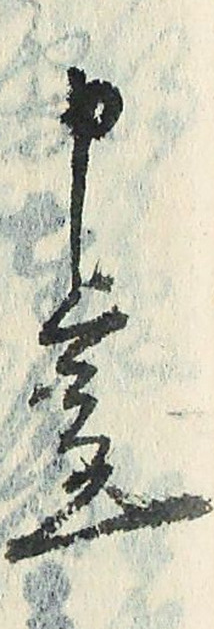申上覚
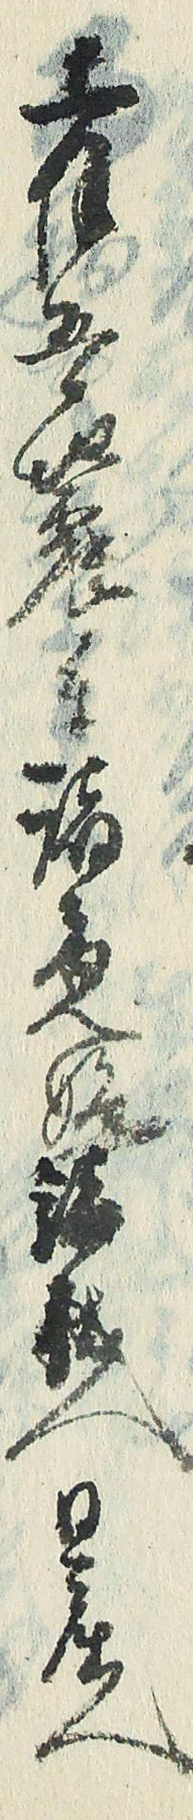十一月五日地震に付諸商人始諸職人日雇人
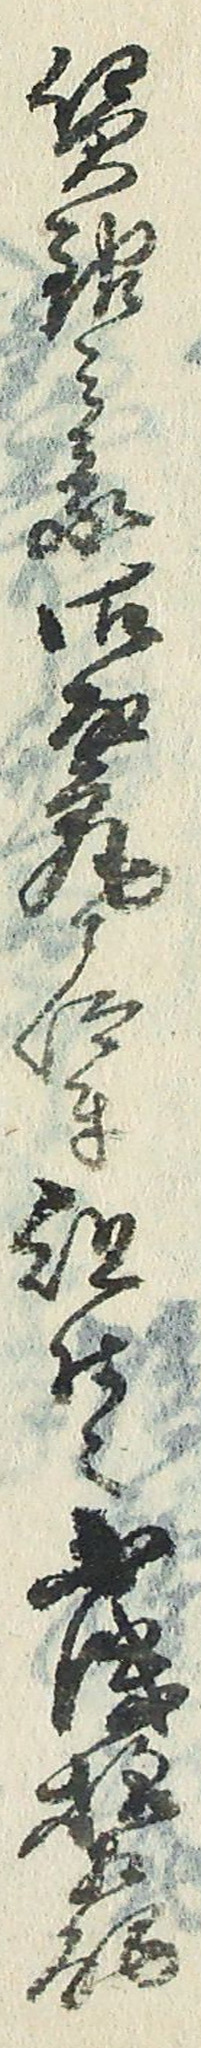賃銀の義御取究被仰付組村々不洩様相触
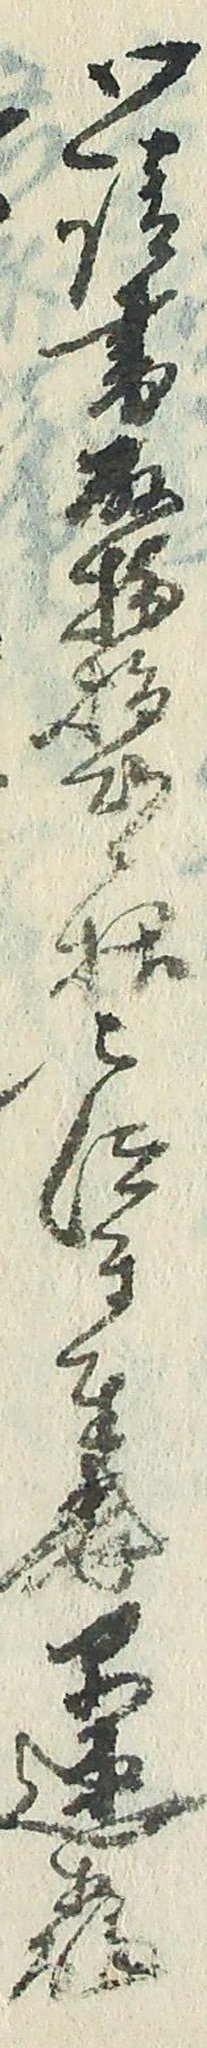御請書取揃指出候様被仰付奉畏早速相触
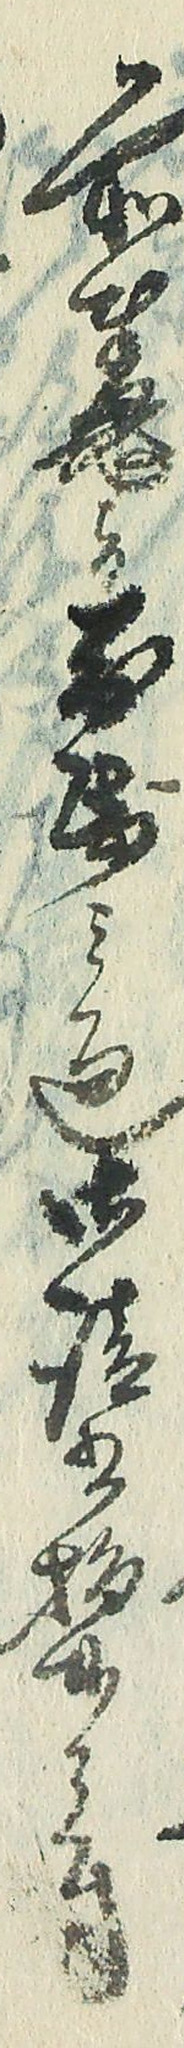候所奉畏旨別帋之通御請書指出候に付
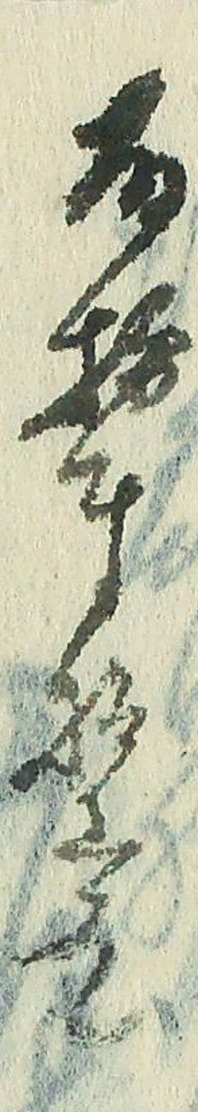取揃奉指上申候以上
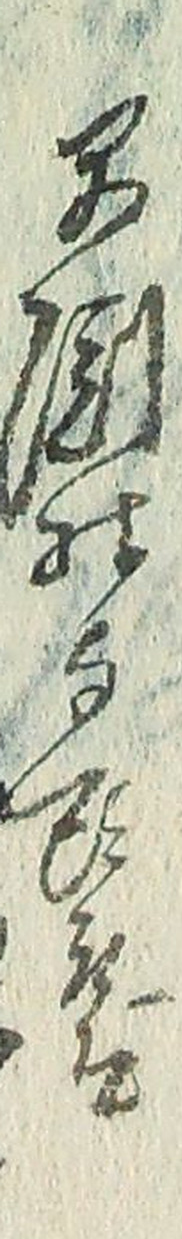早淵村与頭庄屋
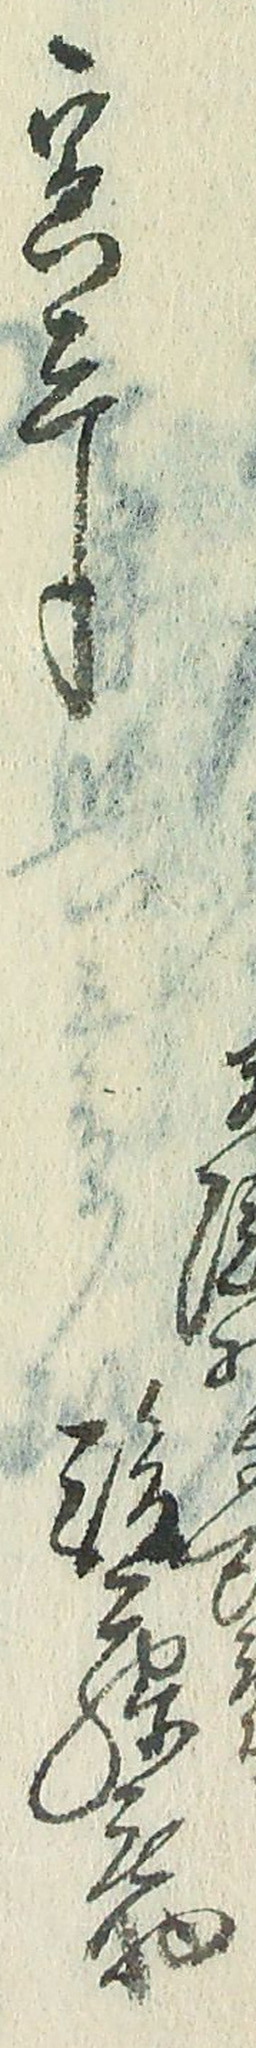寅十二月後藤庄助
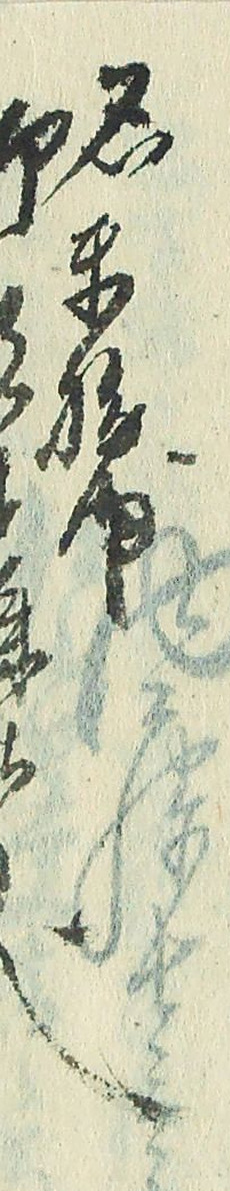名東勝浦
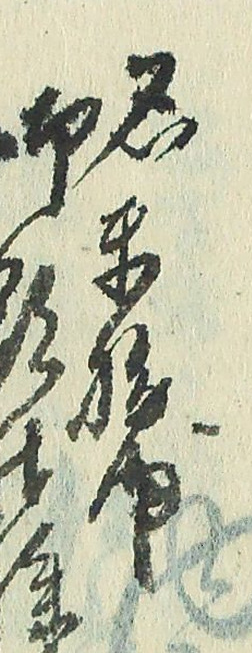名東勝浦
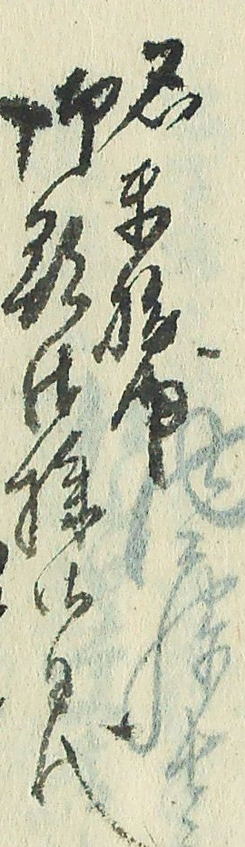御郡代様御手代
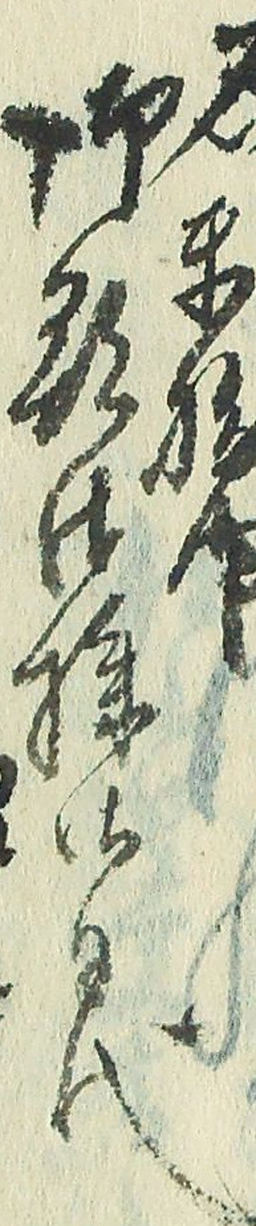御郡代様御手代
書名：諸御用御□受書控
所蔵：鳴門教育大学 Naruto University of Education
